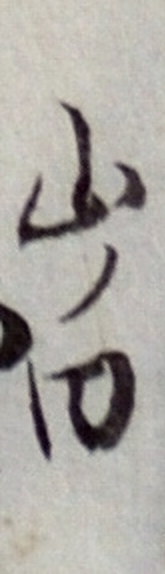山ノ内
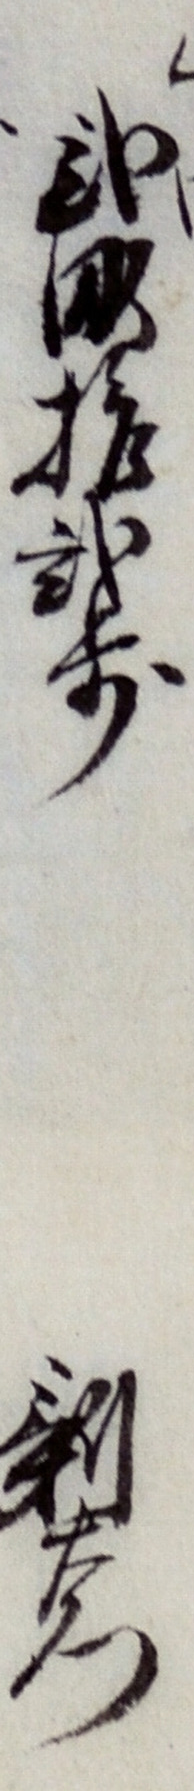弐畝拾弐歩新右衛門
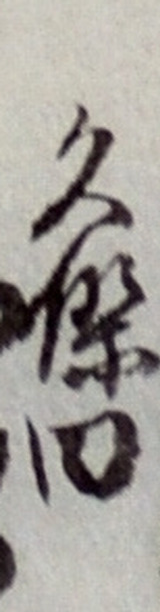久保田
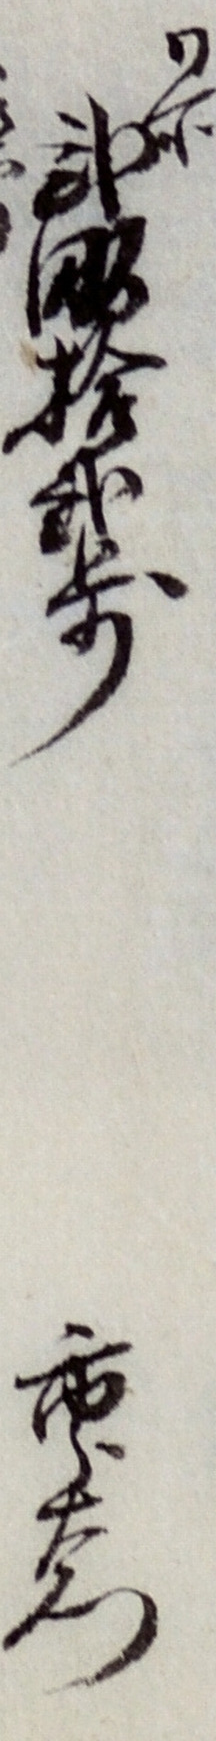弐畝拾弐歩市郎右衛門
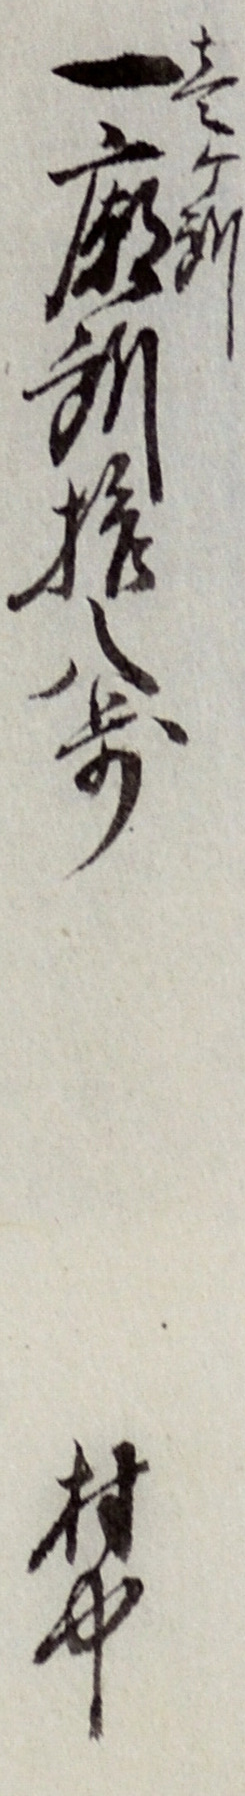一廟所拾八歩村中
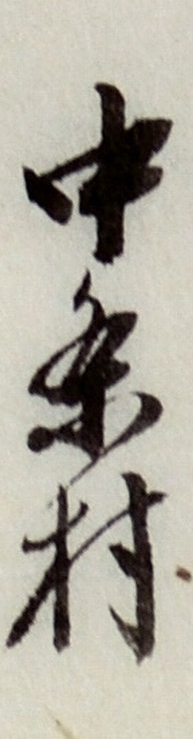中条村
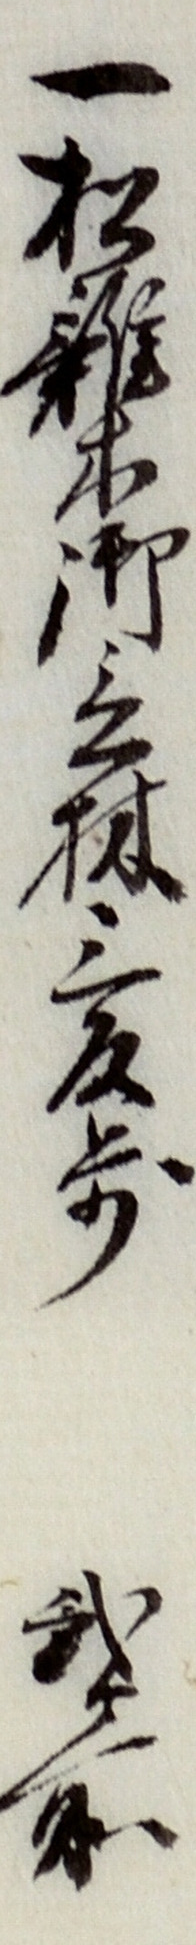一松雑木御立林三反歩弐ヶ所
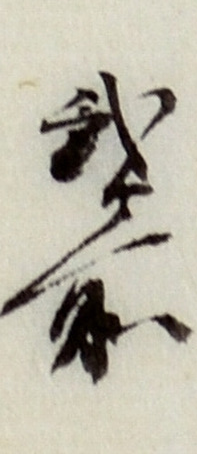壱ヶ所
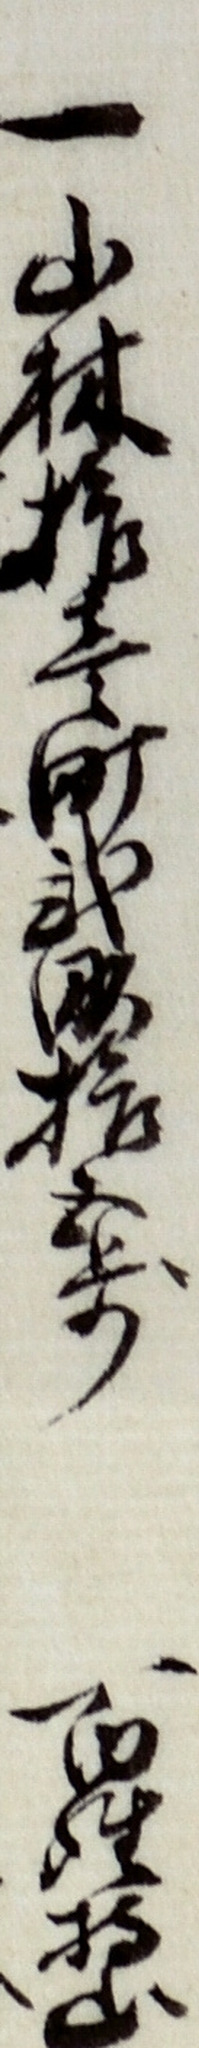一山林拾壱町弐畝拾五歩百姓持山
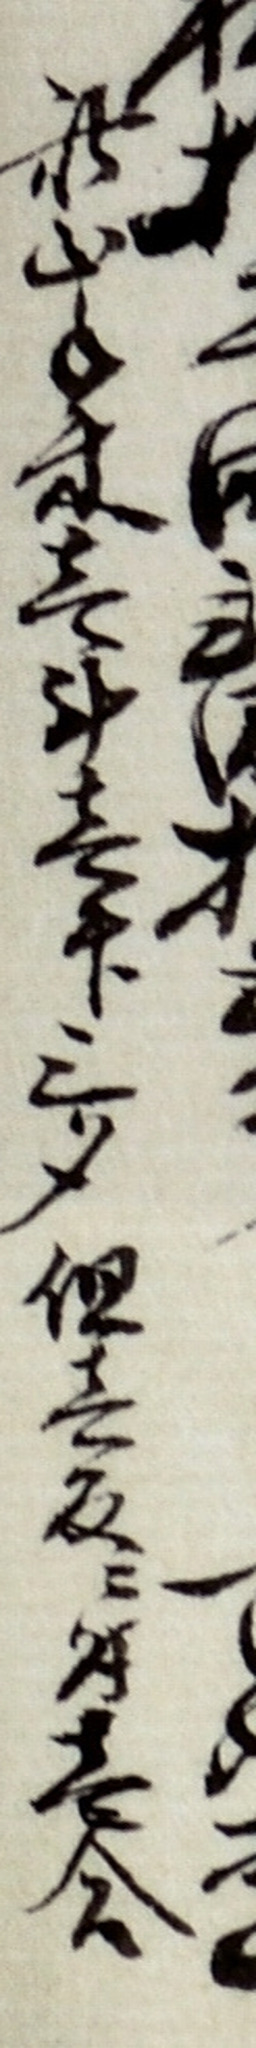此山手米壱斗壱升三夕但壱反ニ付壱合
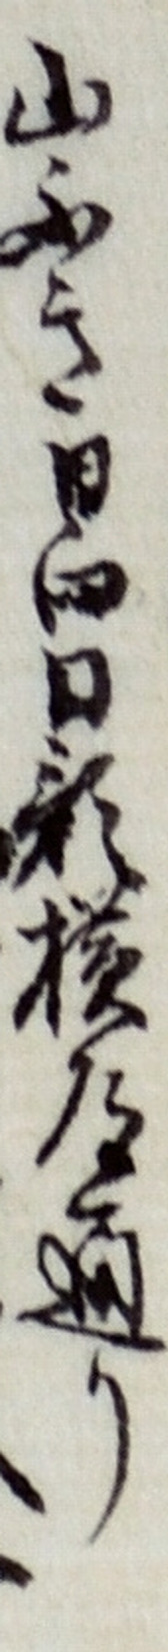山ふき日向日影横道通り
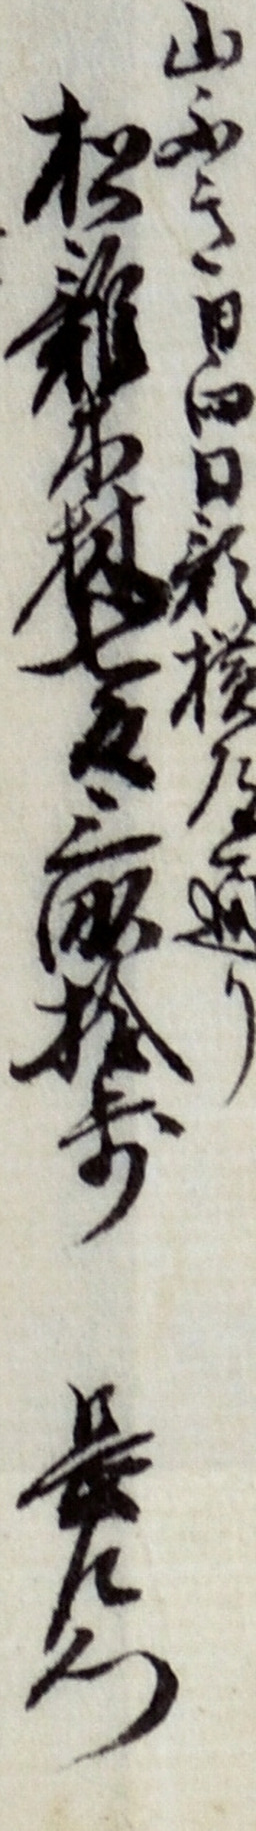松雑木林七反三畝拾歩長左衛門
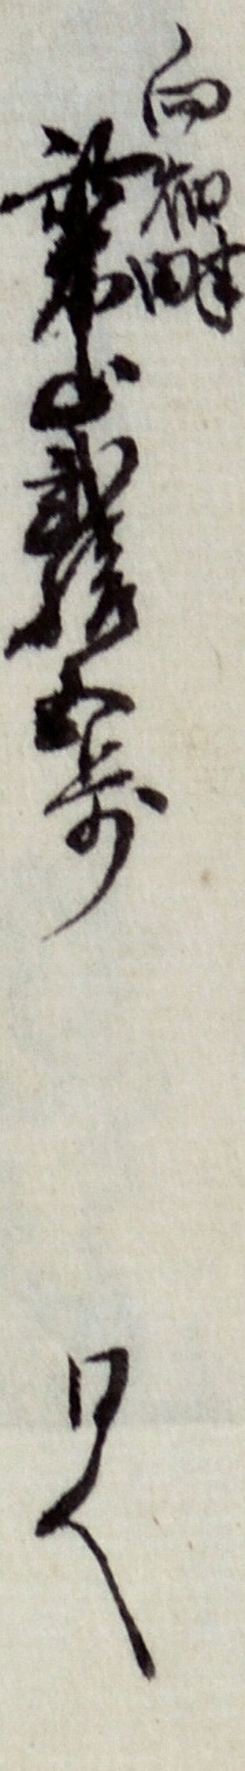柴山弐拾五歩同人
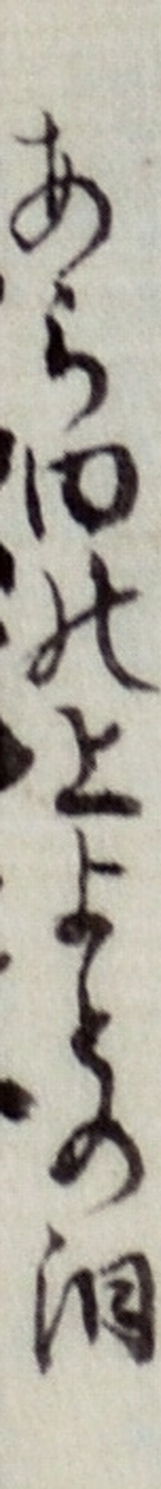あら田の上よとの洞
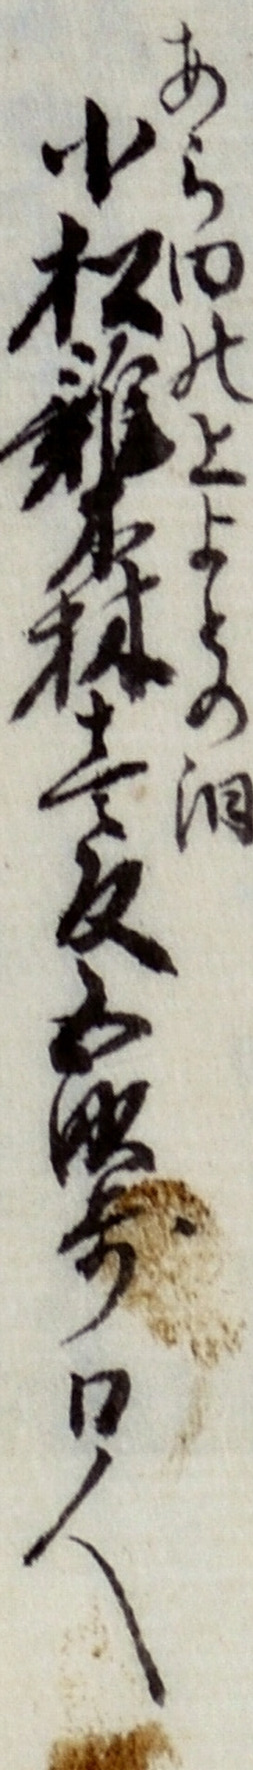小松雑木林壱反五畝歩同人
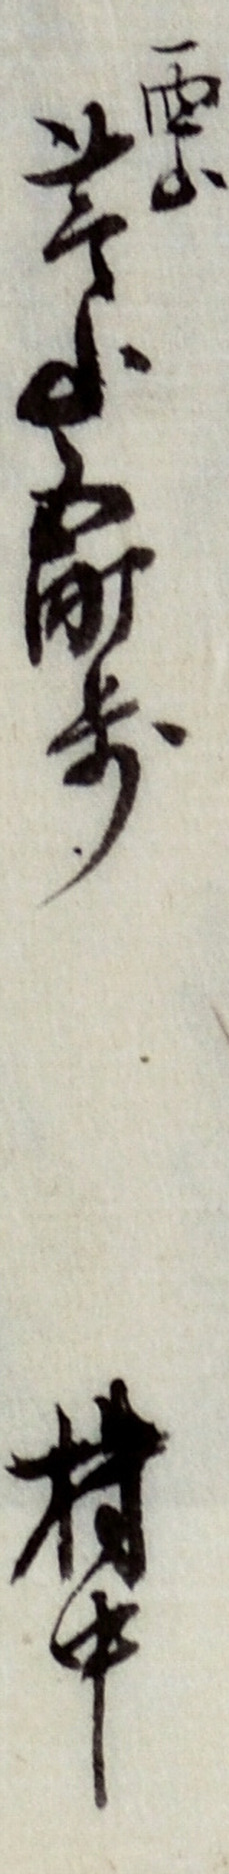芝山五町歩村中
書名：御領分中山林社地手控
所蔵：伊那市立高遠町図書館・合同会社AMANE
